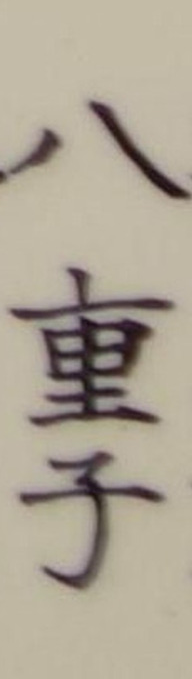八重子
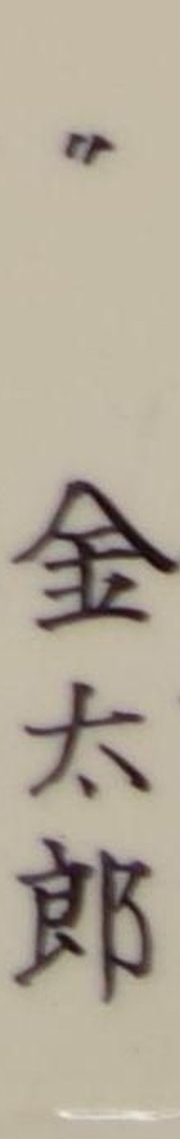金太郎
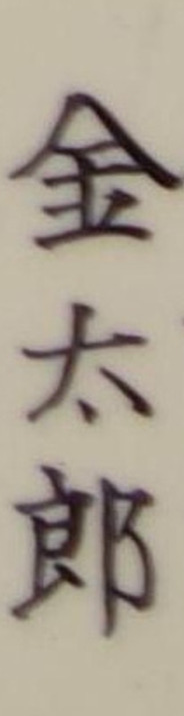金太郎
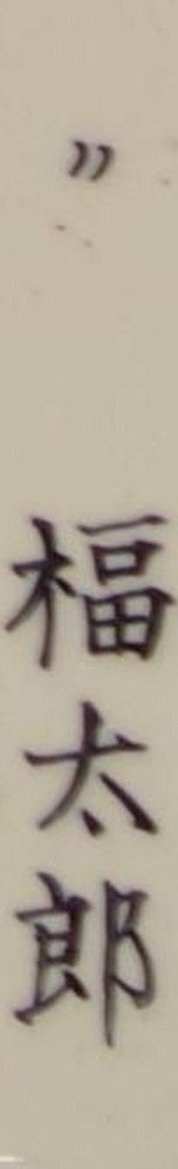福太郎
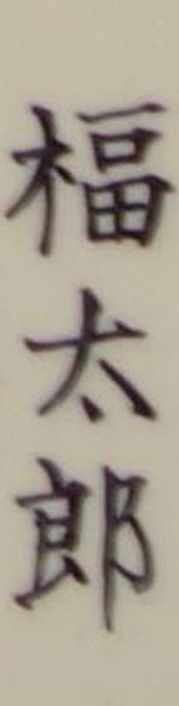福太郎
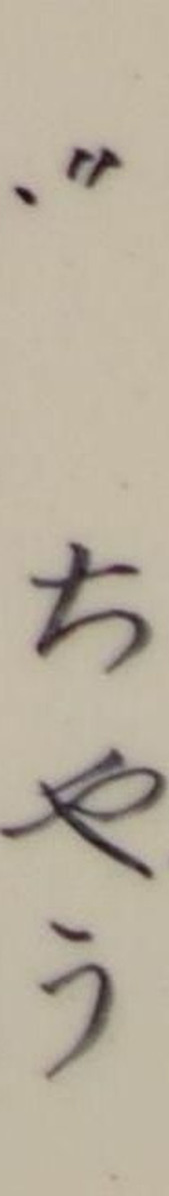ちやう
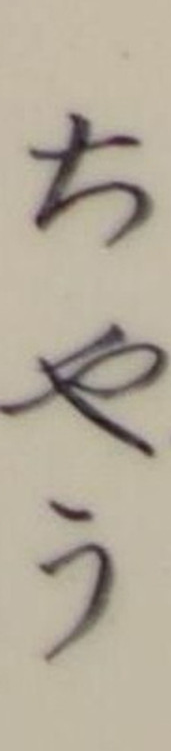ちやう
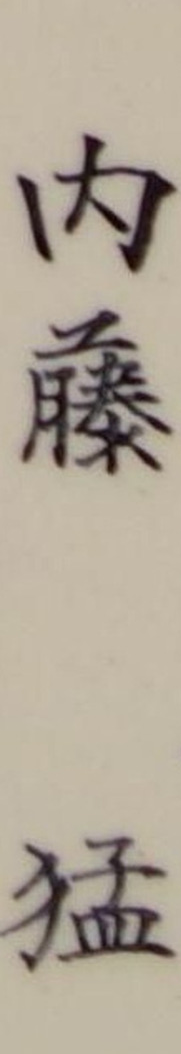内藤猛
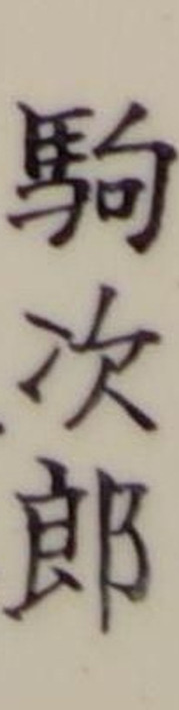駒次郎
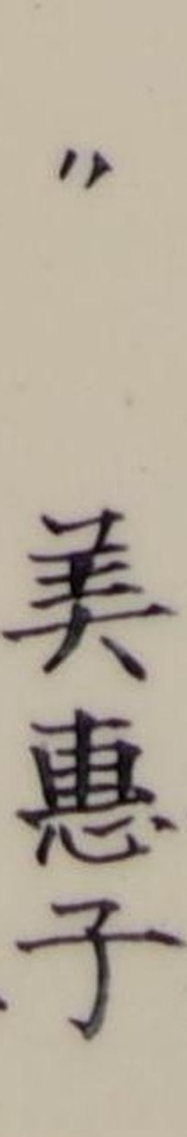美恵子
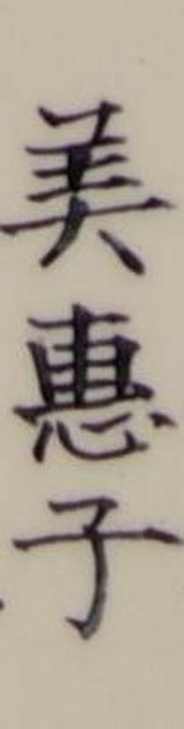美恵子
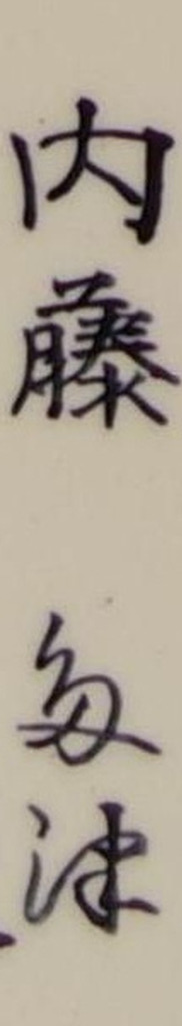内藤多津
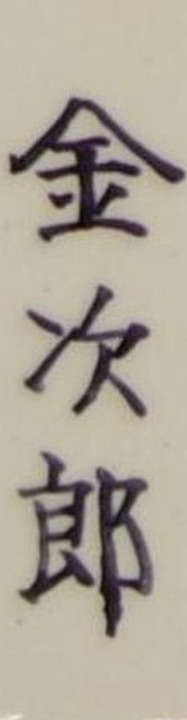金次郎

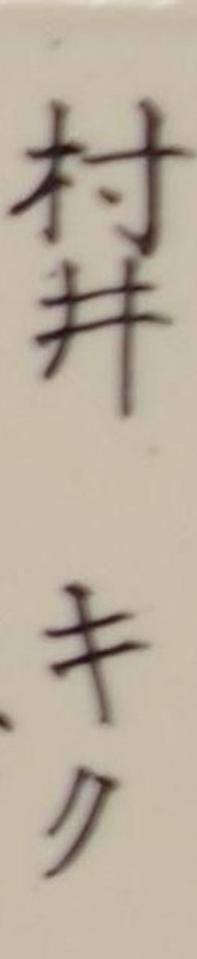村井キク
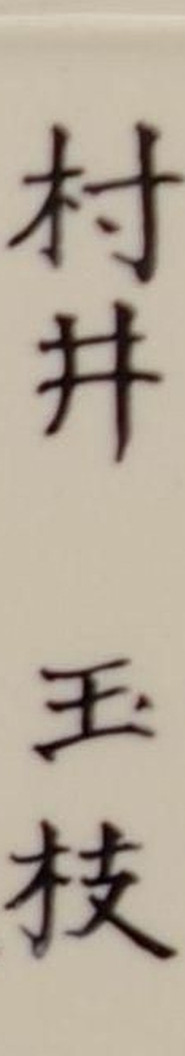村井玉枝
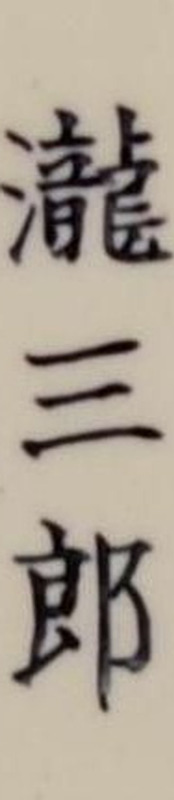瀧三郎
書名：M~S
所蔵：高野山金剛峯寺
